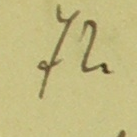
72
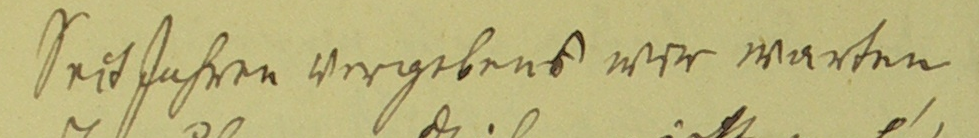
Seit Jahren vergebens wir warten
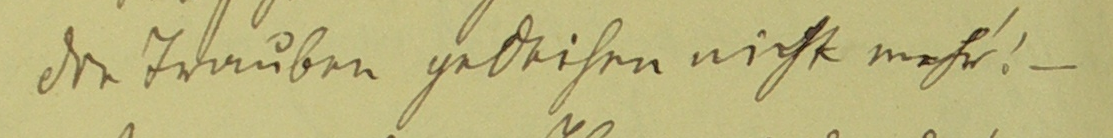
Die Trauben gedeihen nicht mehr!-
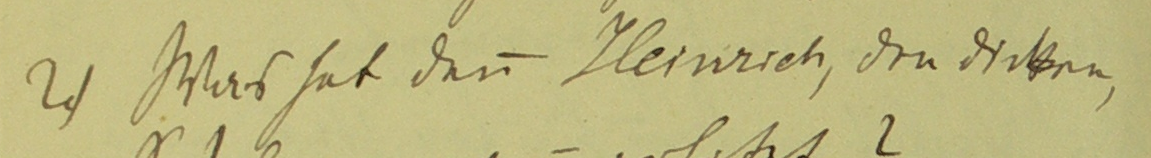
2) Was hat den Heinrich, den Dicken
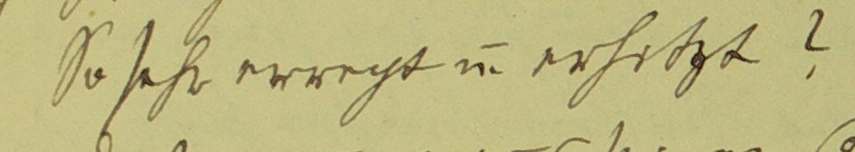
So sehr erregt und erhitzt ?
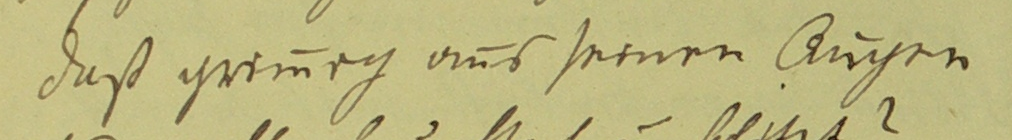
Daß grimmig aus seinen Augen
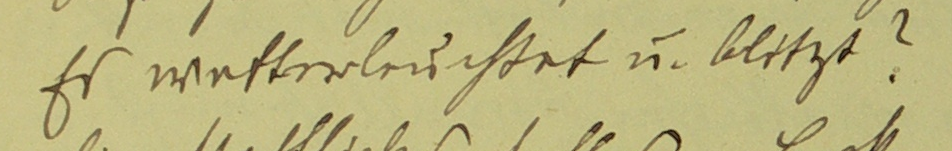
Es wetterleuchtet und blitzt?
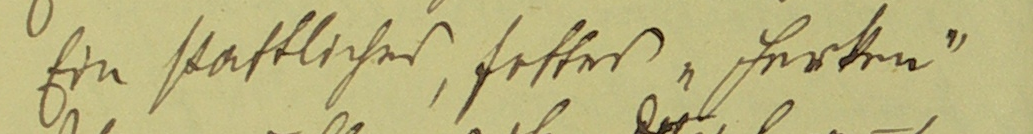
Ein stattliches, fettes „ Ferken“
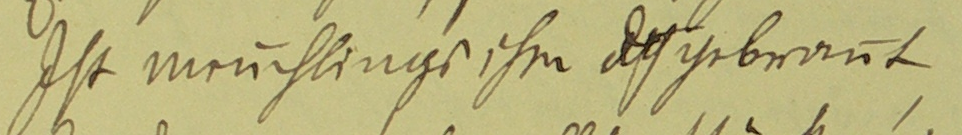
Ist meuchlings ihm durchgebrannt
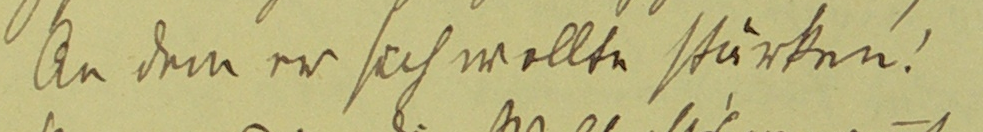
An dem er sich wollte stärken !
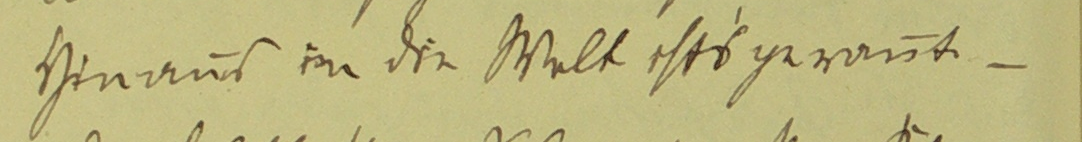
hinaus in die Welt ist‘s gerannt.
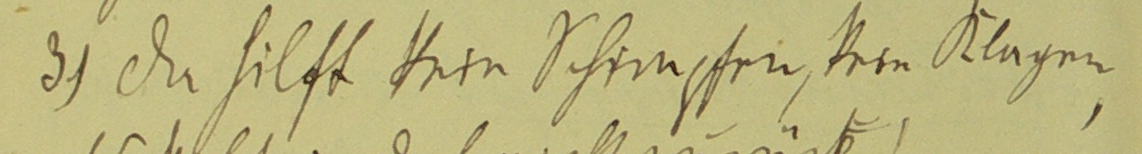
3) Da hilft kein Schimpfen, kein Klagen
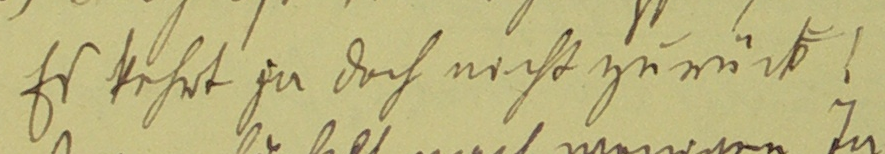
Es kehtr ja doch nicht zurück !,
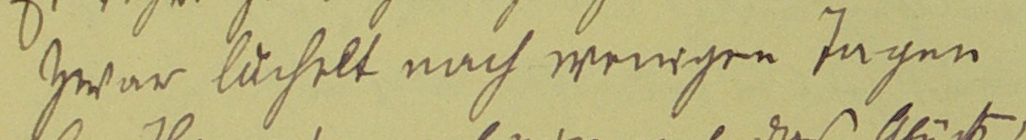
Zwar lächelt nach wenigen Tagen
